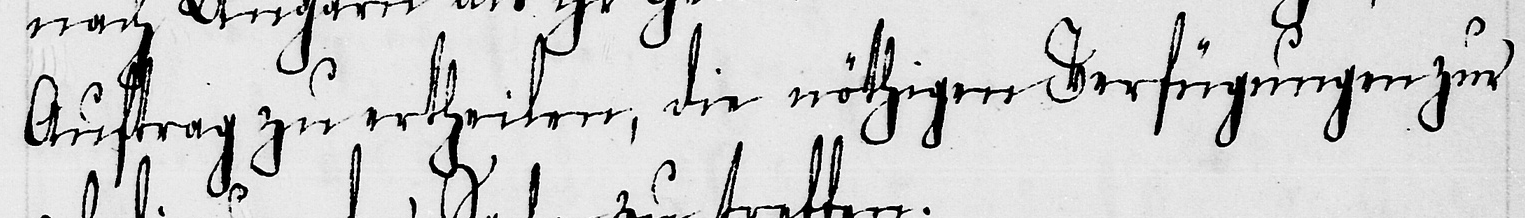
Auftrag zu ertheilen, die nöthigen Verfügungen zur
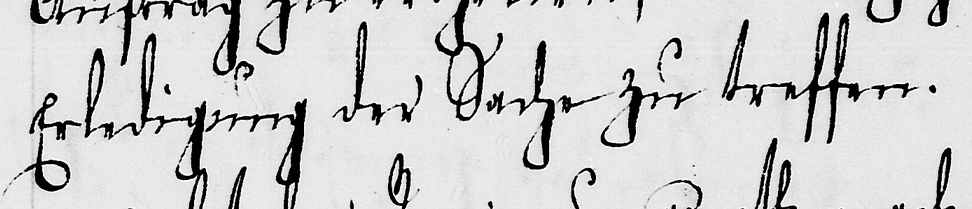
Erledigung der Sache zu treffen.
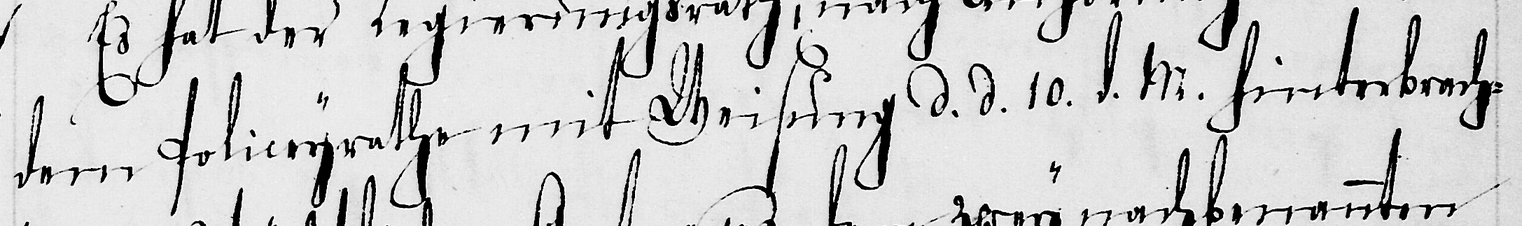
dem Policeyrathe mit Weisung d. d. 10. d. M. hinterbrach¬
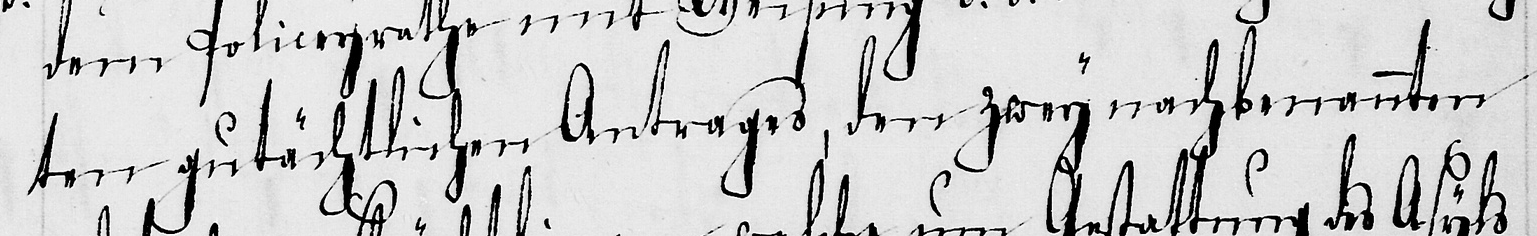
ten gutächtlichen Antrages, den zwey nachbenannten
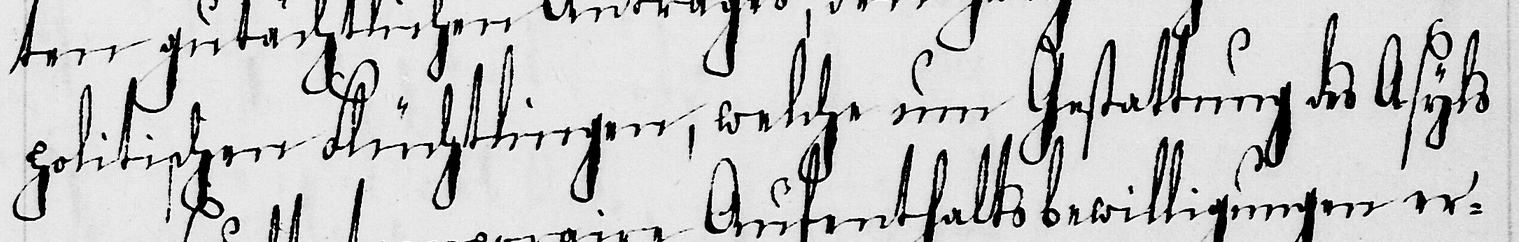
politischen Flüchtlingen, welche um Gestattung des Asyls
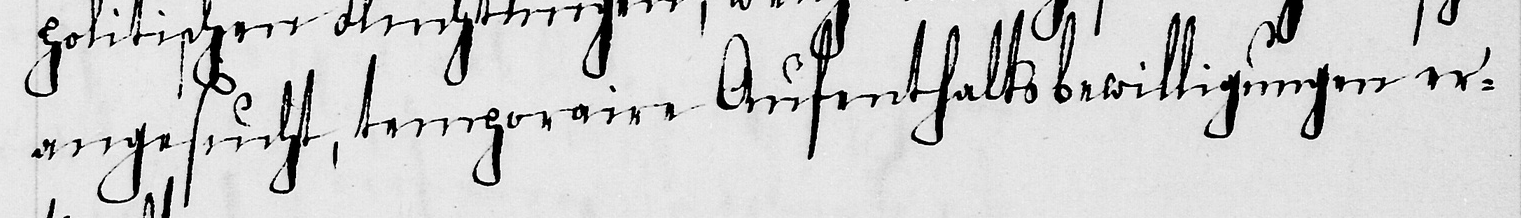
angesucht, temporaire Aufenthaltsbewilligungen er¬
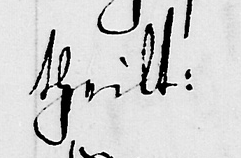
theilt:
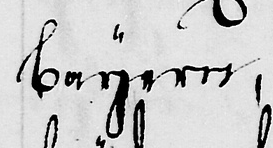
Bayern,
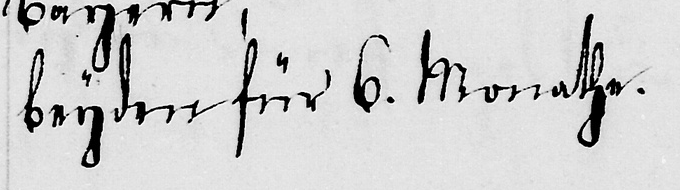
beyden für 6. Monathe.
